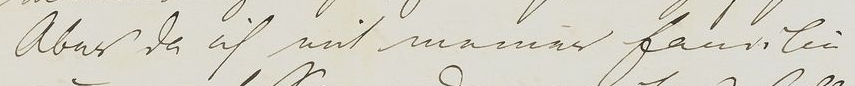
Aber da ich mit meiner Familie
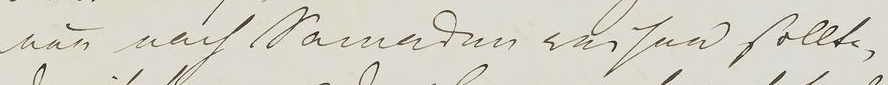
nun nach Samaden reisen sollte,
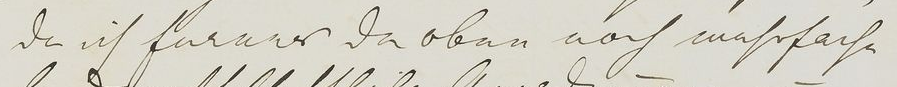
da ich ferner da oben noch mehrfache
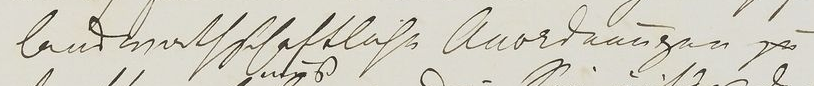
landwirthschaftliche Anordnungen zu
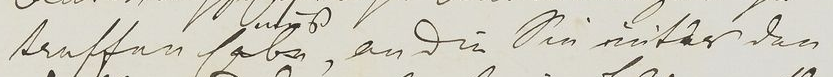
treffen habemuß, an die Sie unter den
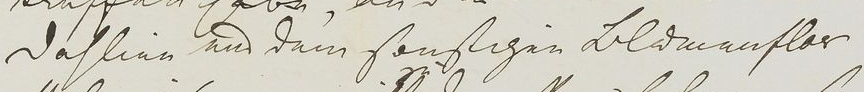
Dahlien und dem sonstigen Blumenflor
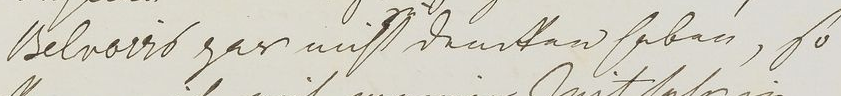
Belvoirs gar nicht zu dencken haben, so
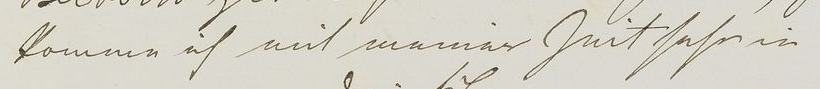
komme ich mit meiner Zeit sehr in
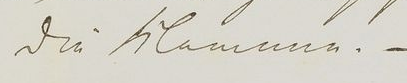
die Klemme. –
